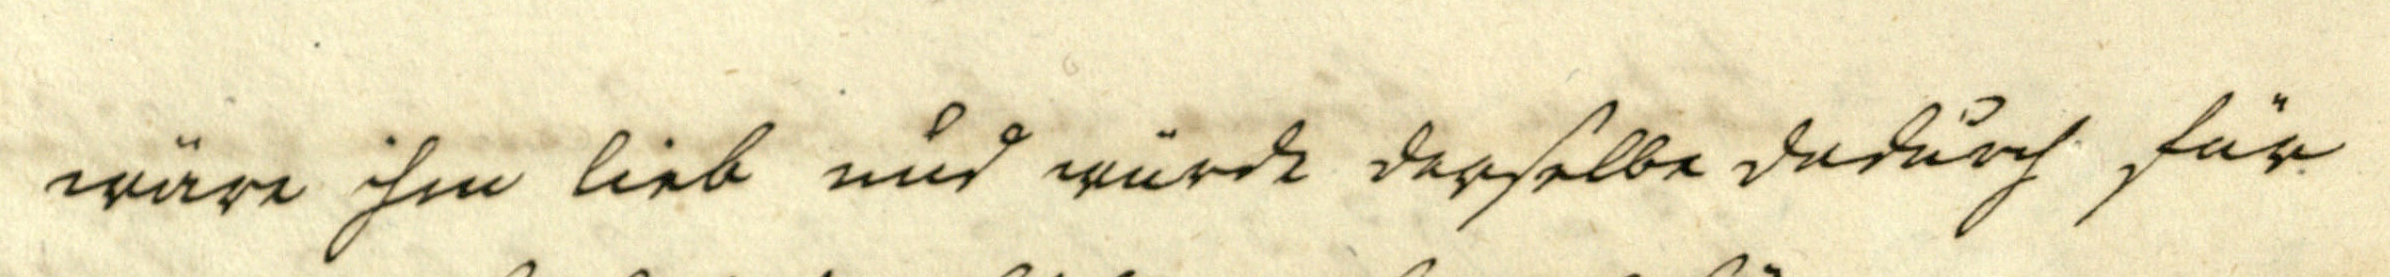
wäre ihm lieb und würde derselbe dadurch für
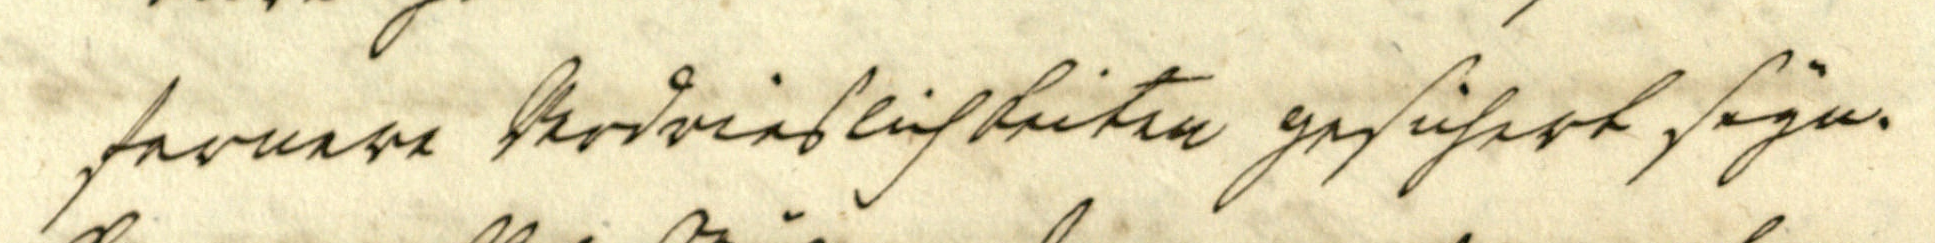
fernere Verdrieslichteiten gesichert seÿn.
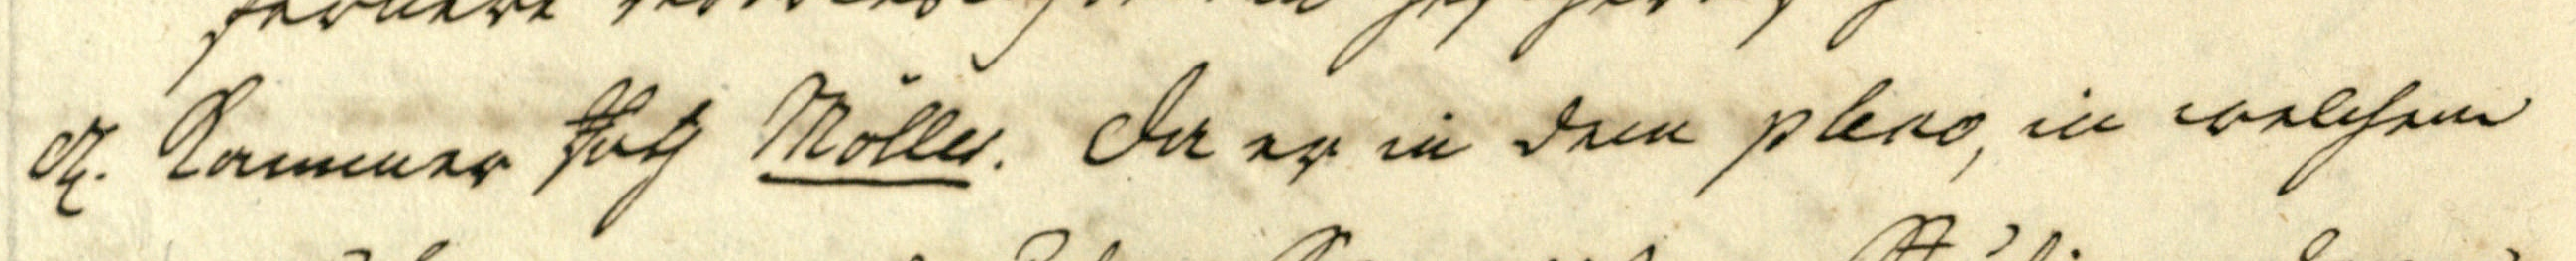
dh. Kammer Rath Möller. Da er in dem pleno, in welchem
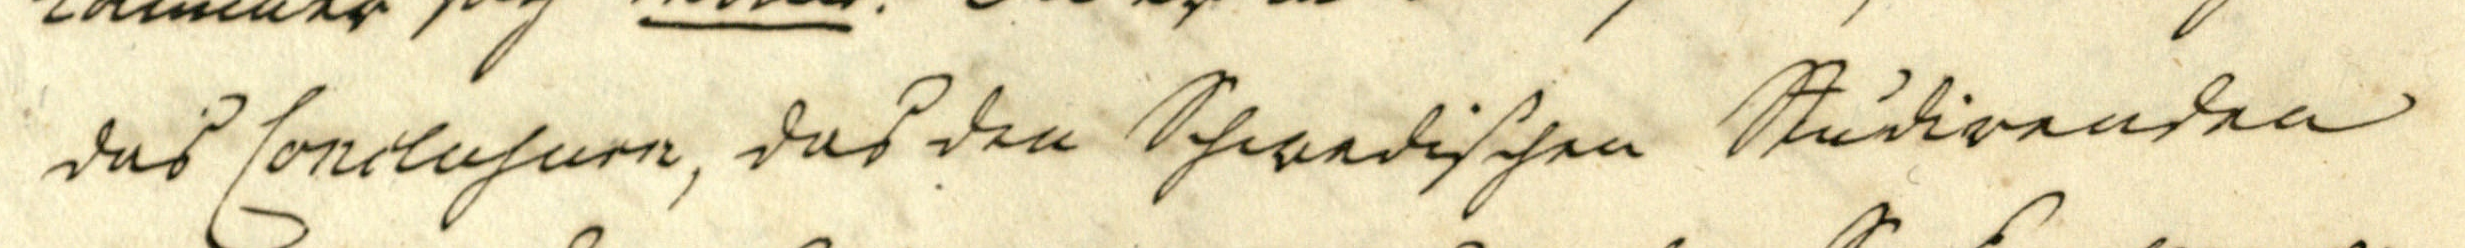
das Conclusum, das den Schwedischen Studirenden
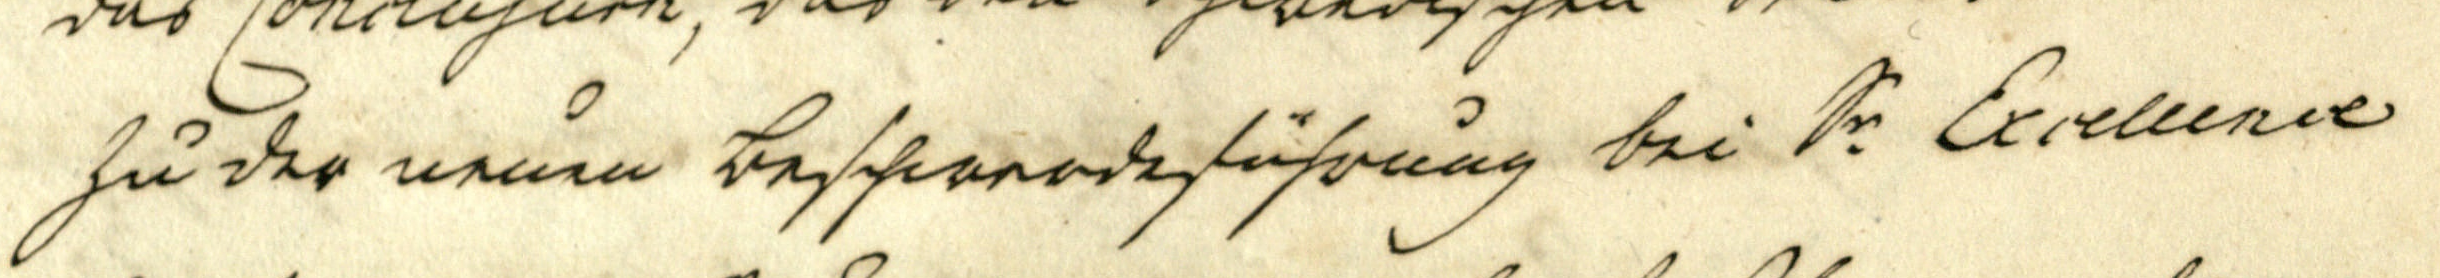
zu der neuem Beschwerdeführung bei Sr Excellence
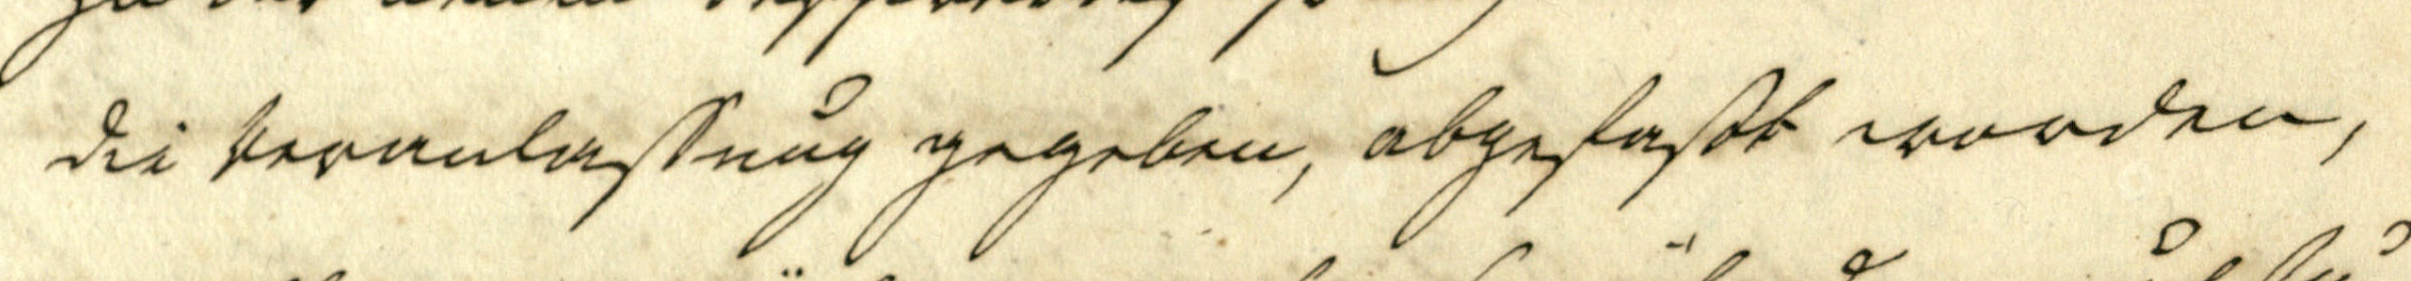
die Veranlassung gegeben, abgefaßt worden,
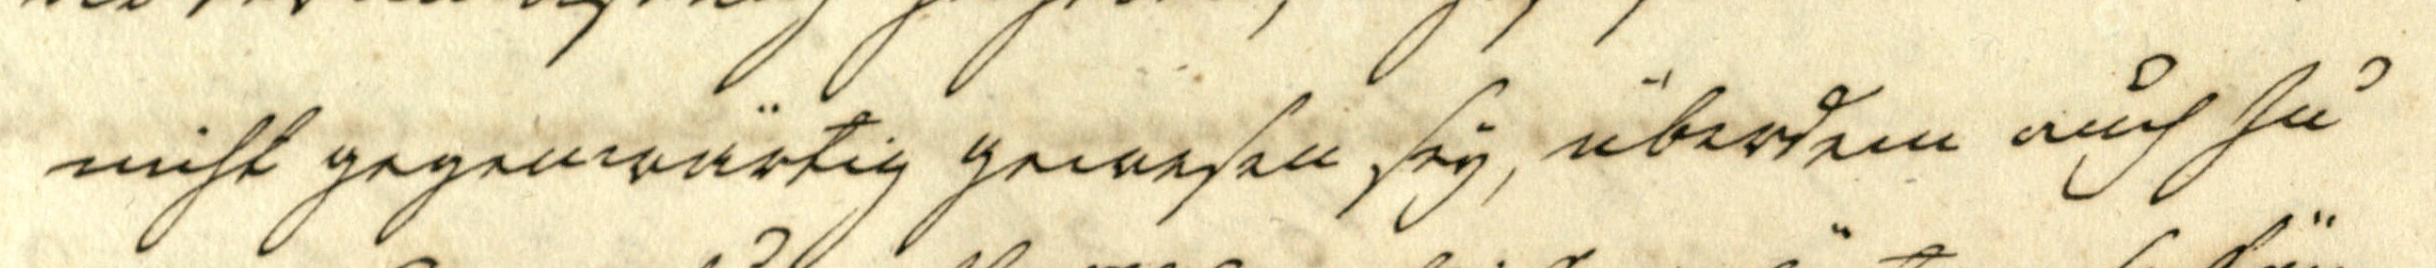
nicht gegenwärtig gewesen seÿ, überdem auch zu
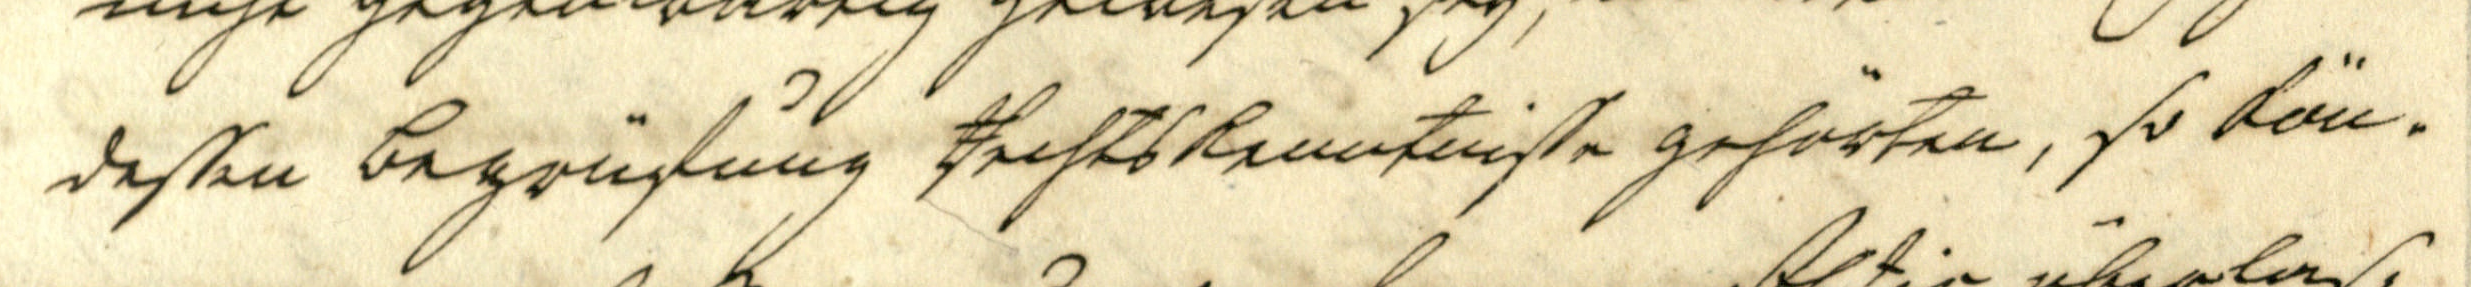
dessen Beprüfung Rechtskenntnisse gehörten, so kön¬
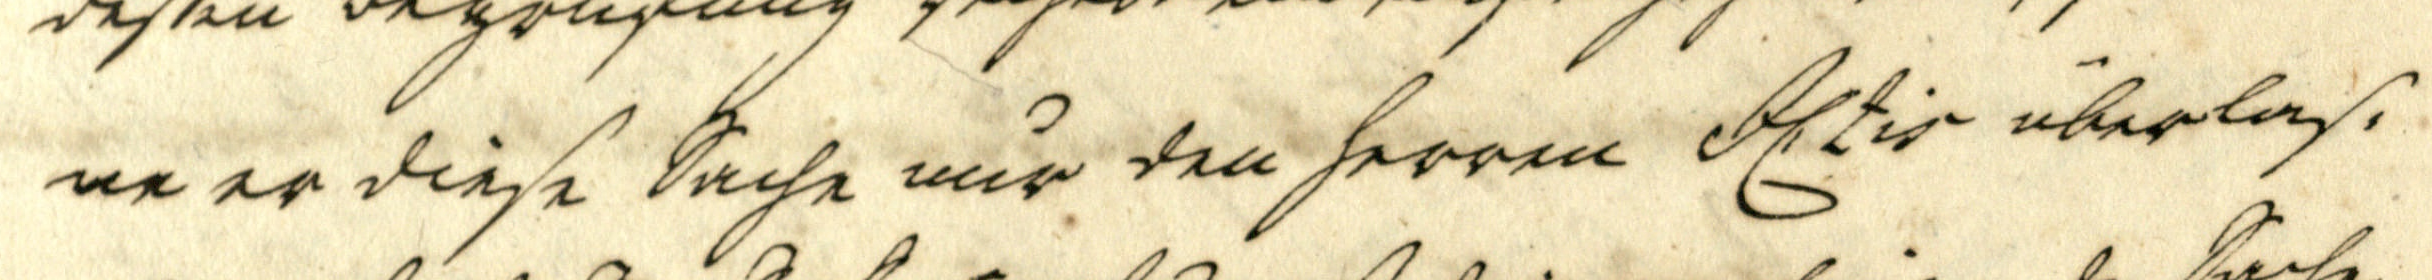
ne er diese Sache nur den Herren Iltis überlas¬
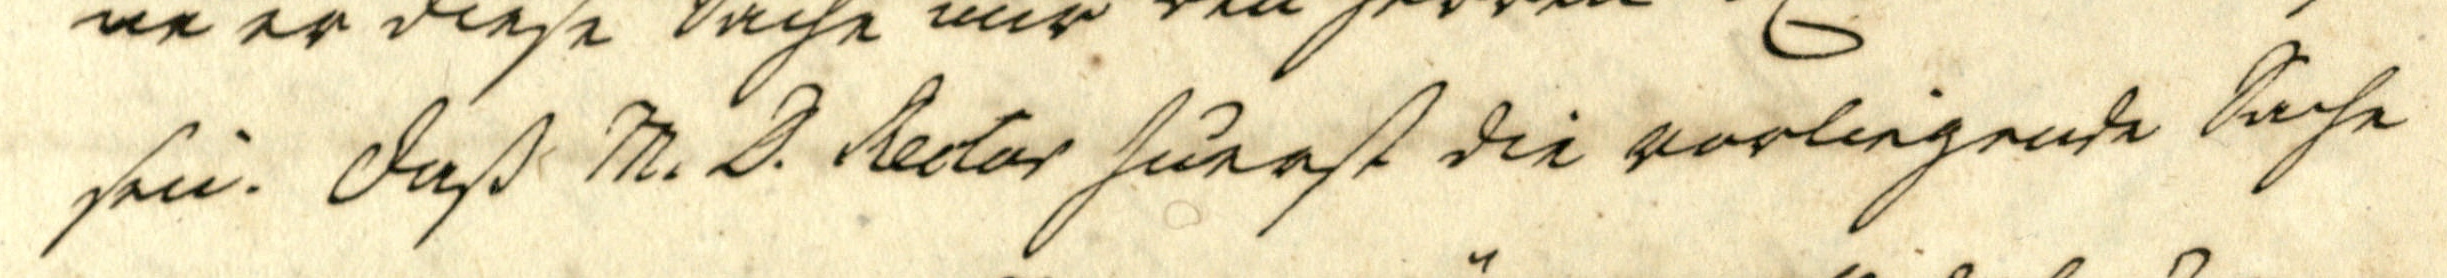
sen. Daß M. D. Rector zuerst die vorliegende Sache
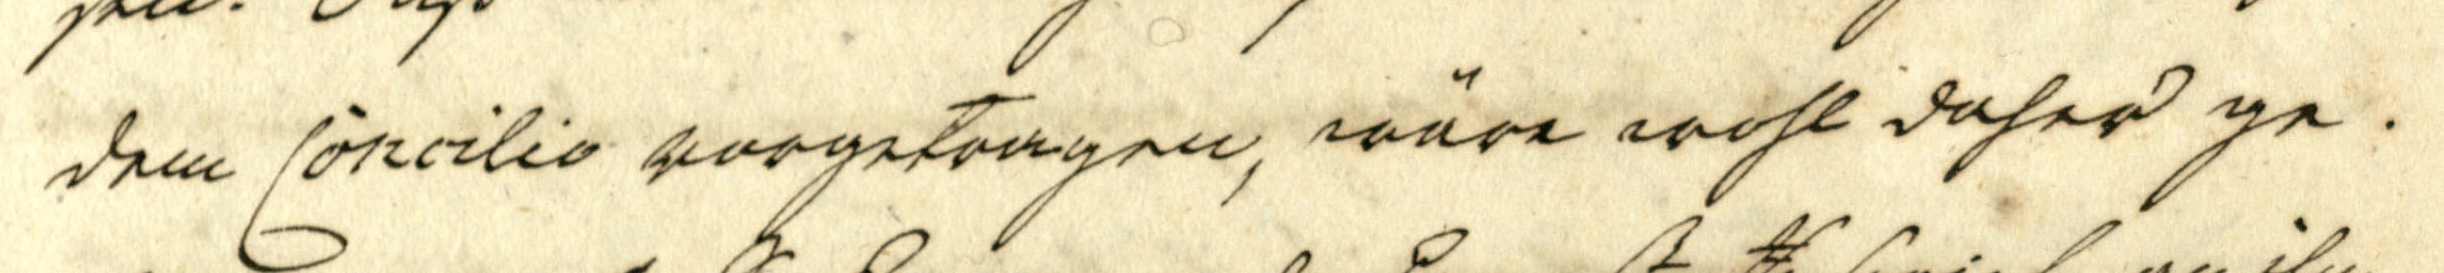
dem Concilio vorgetragen, wäre wohl daher ge¬
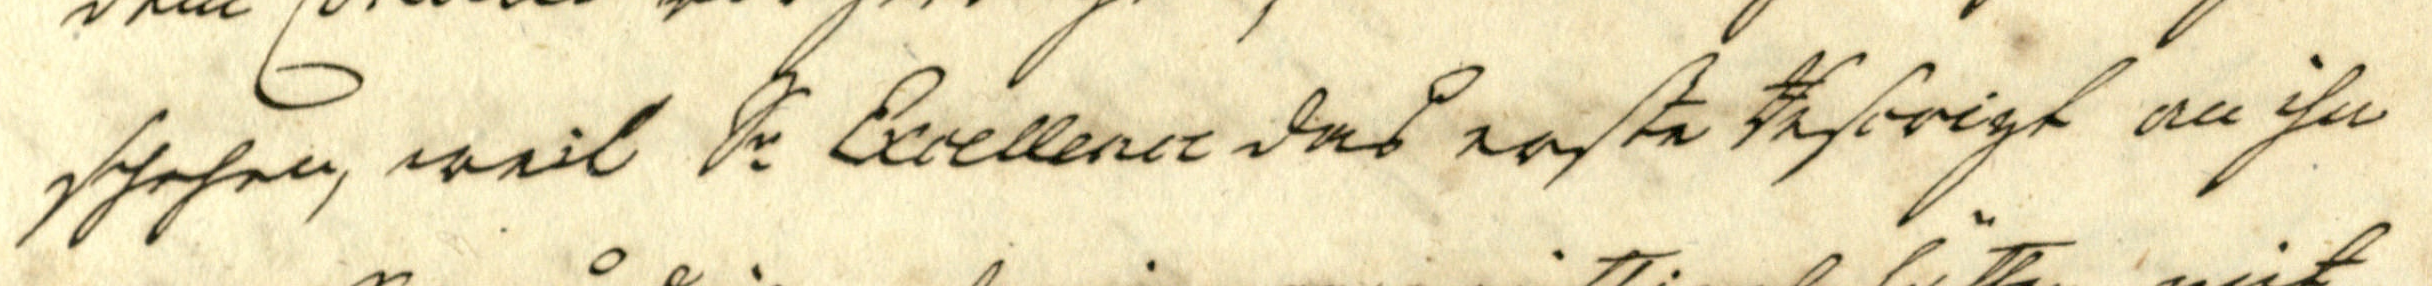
schehen, weil Sr. Excellence das erste Rescrigt an ihn
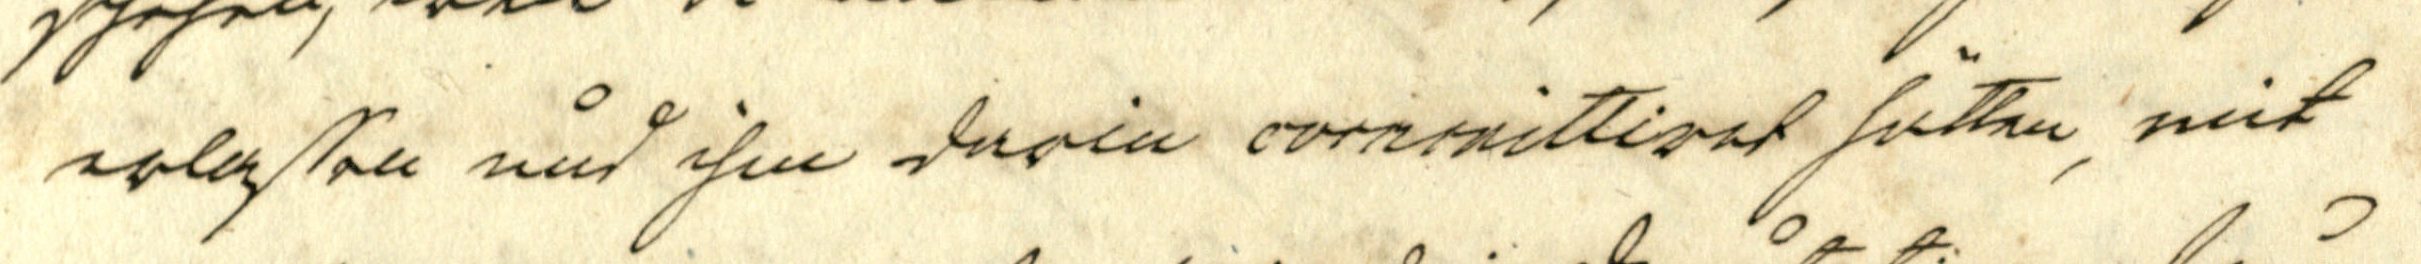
erlassen und ihm darin committiret hätten mit
